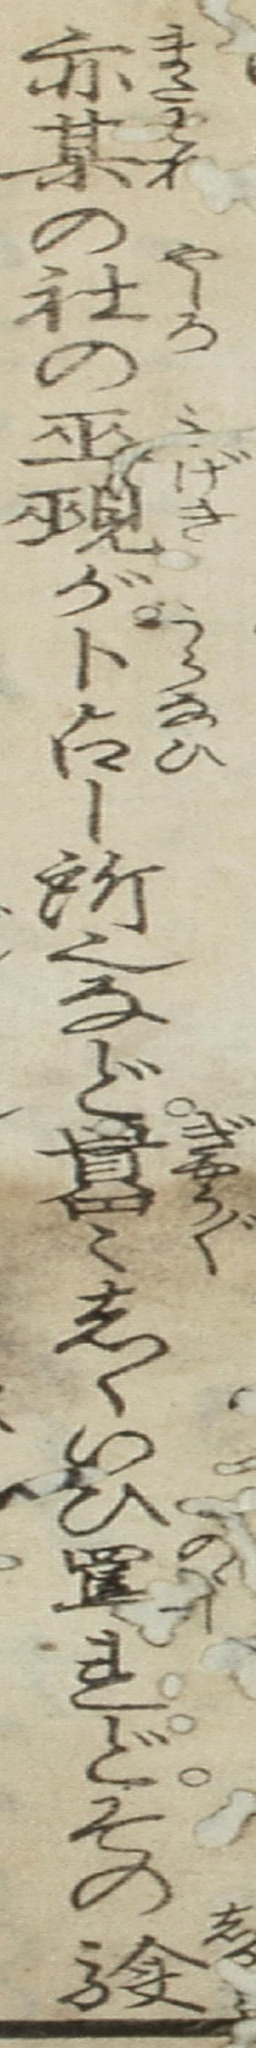亦某の社の巫覡が卜占し所也など。囂〻しく詈れど。その験
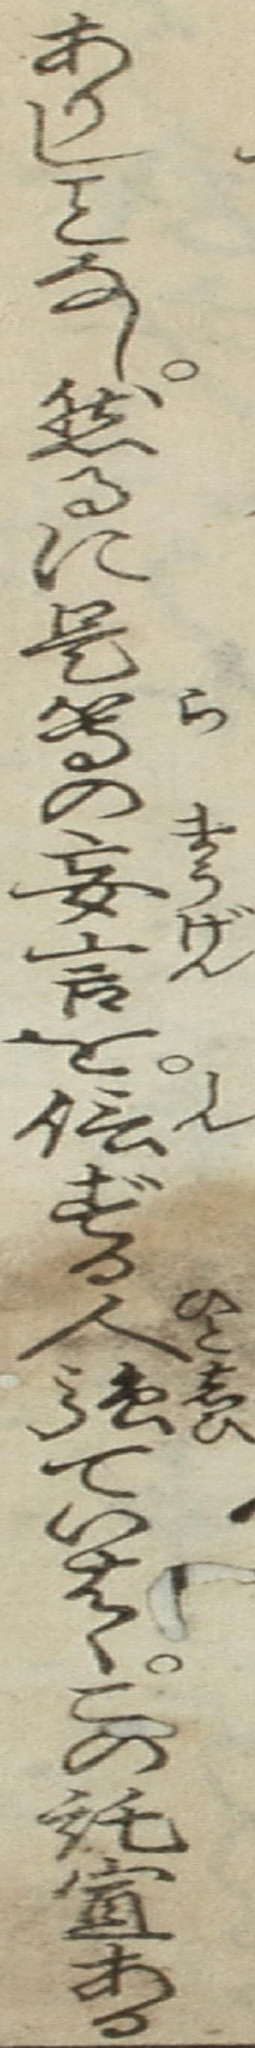ありしことなし。然るに是等の妄言を。信ずる人強ていはく。この託宣ある
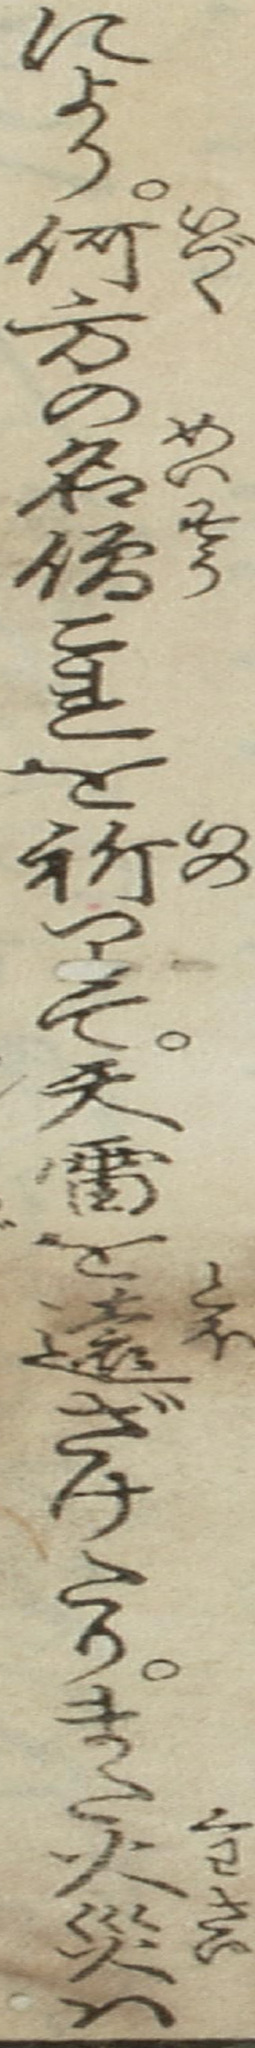により。何方の名僧これを祈りて。天雷を遠ざけたり。また火災は
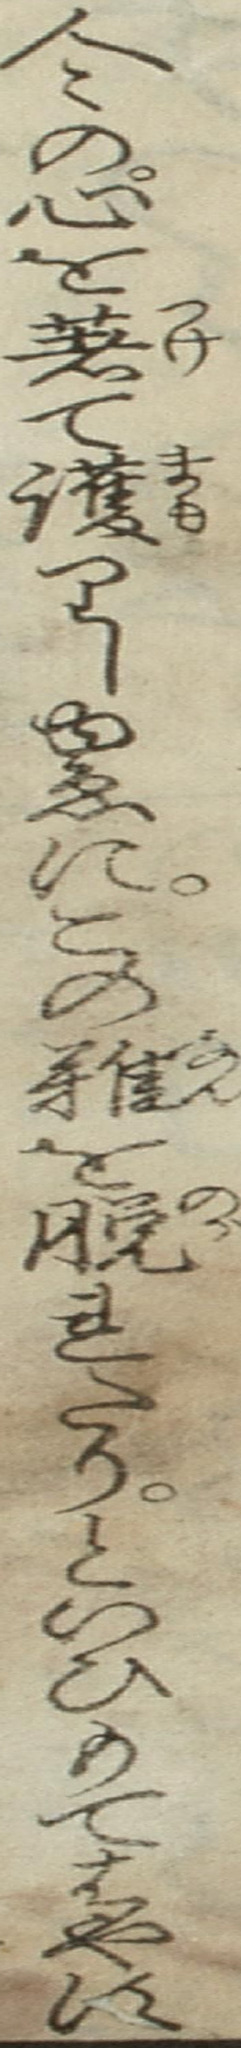人〻の。心を著て護りしゆゑに。この難を脱れたり。といひもてはやす
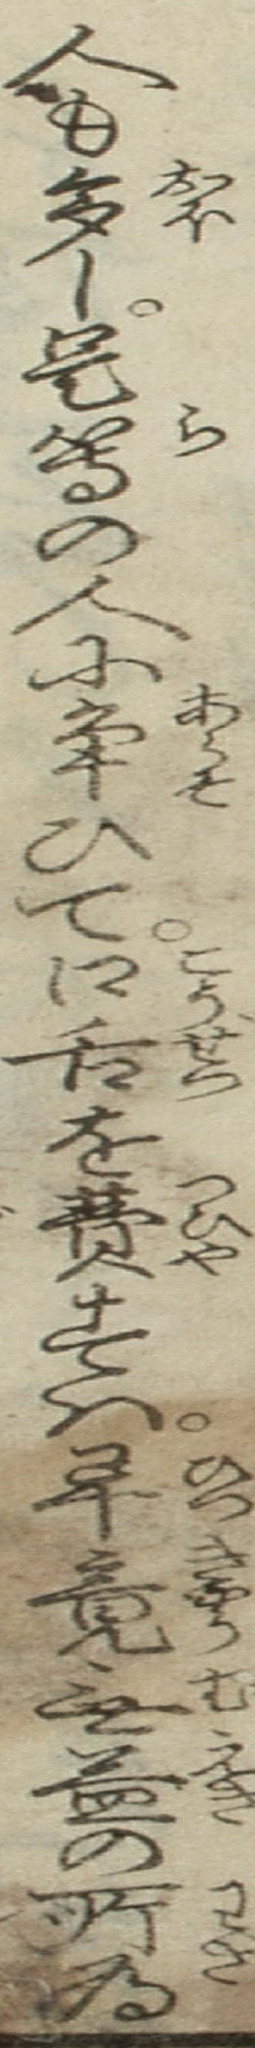人も多し。是等の人に争ひて。口舌を費すは。畢竟無益の所為
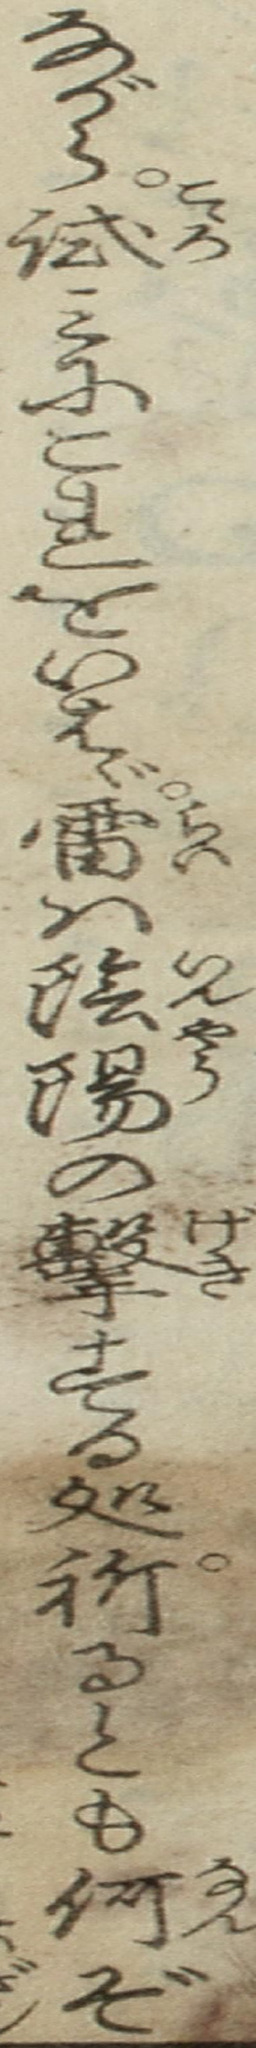ながら。試みにこれをいはゞ。雷は陰陽の撃する処。祈るとも何ぞ
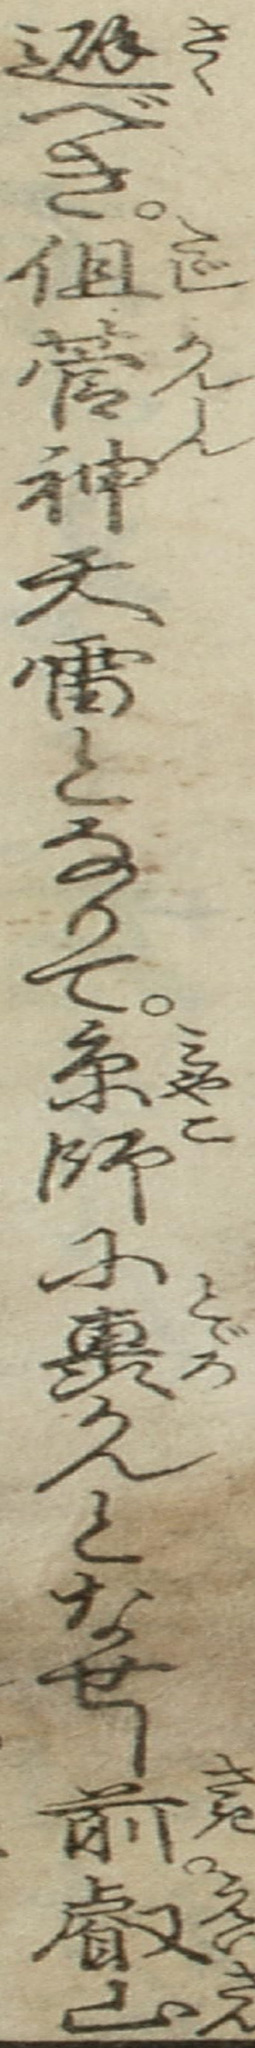避べき。但菅神天雷となりて。京師に轟かんとなせし前。叡山
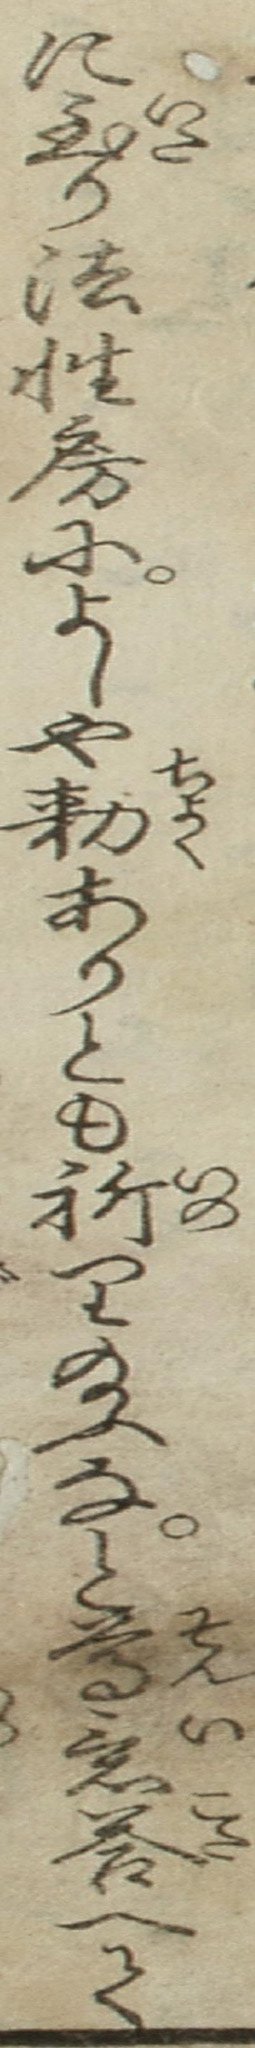に至り法性房に。よしや勅ありとも祈り給ふな。と尊意答へて
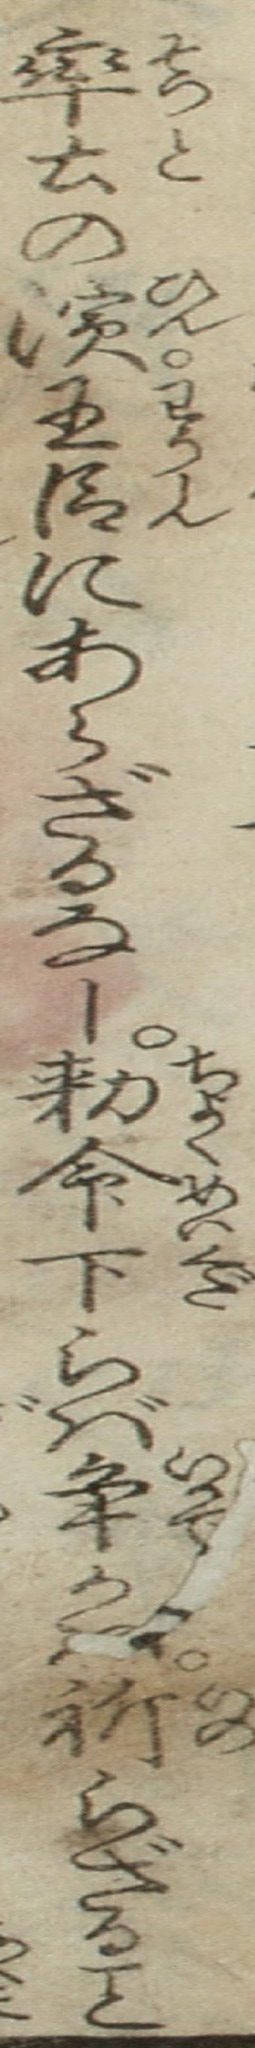率土の濱。王臣にあらざるなし。勅命下らば争かは。祈らざること
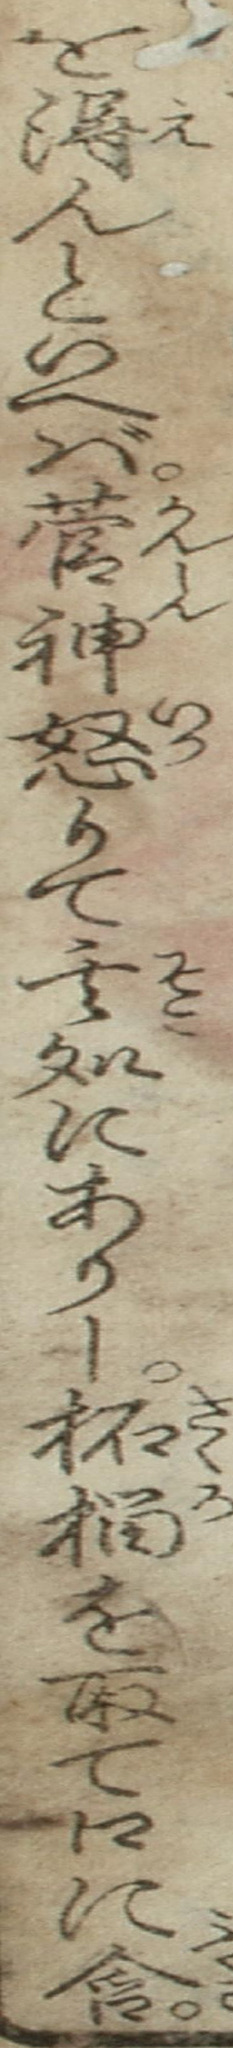を得んといへば。菅神怒りて其処にありし。柘榴を取て口に含。

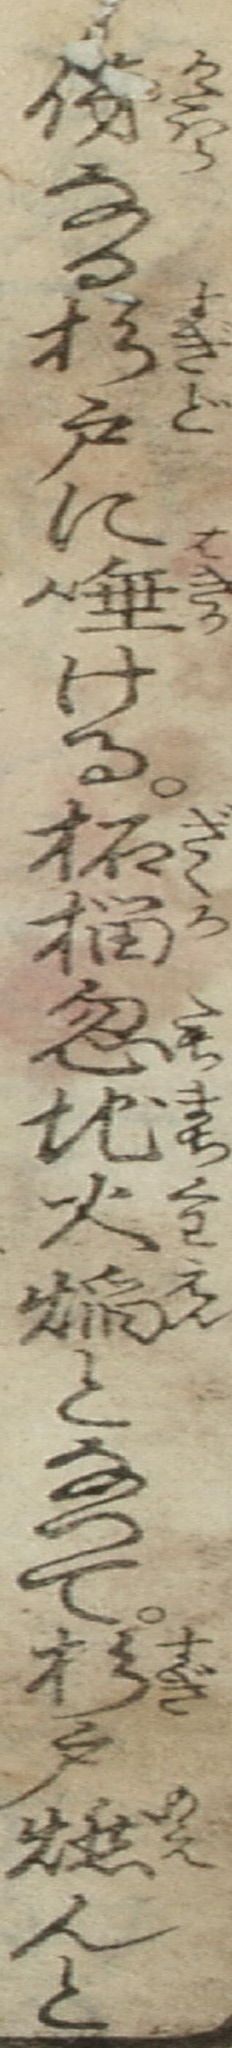傍なる杉戸に唾ける。柘榴忽地火焔となつて杉戸燃んと
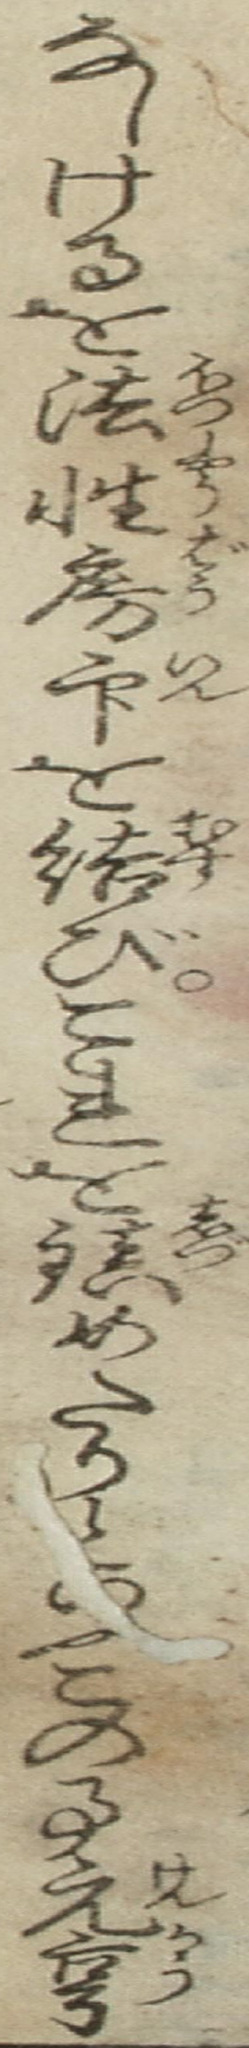なしけるを法性房印を結び。これを鎮めたりといふこの事元亨
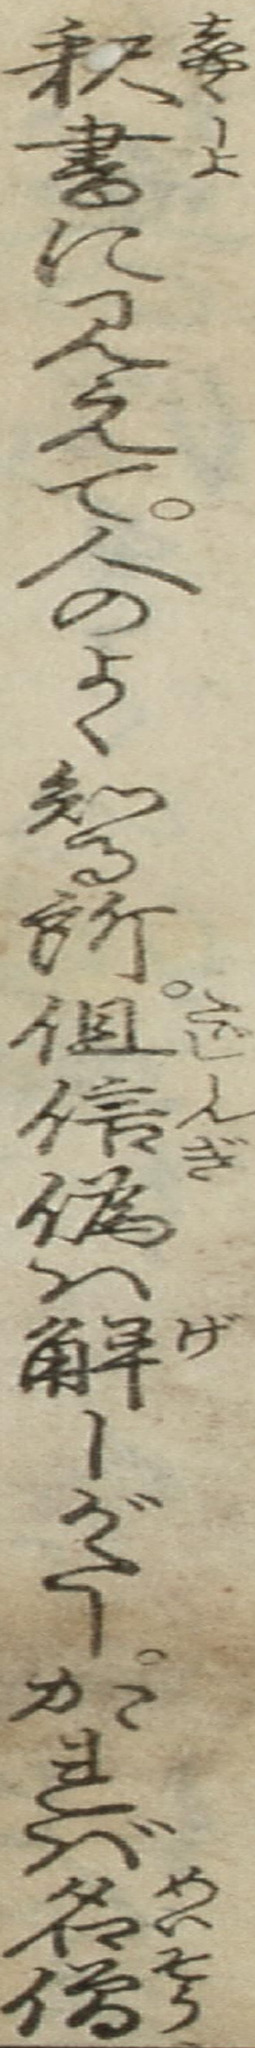釈書に見えて。人のよく知る所。但信偽は解しがたし。かゝれば名僧
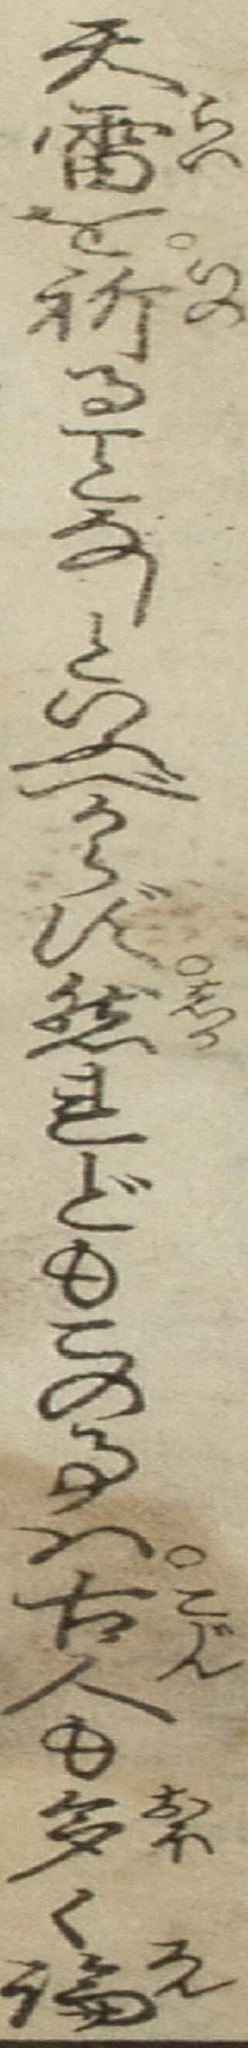天雷を。祈ることなしといふべからず。然れどもこの事は。古人も多く論
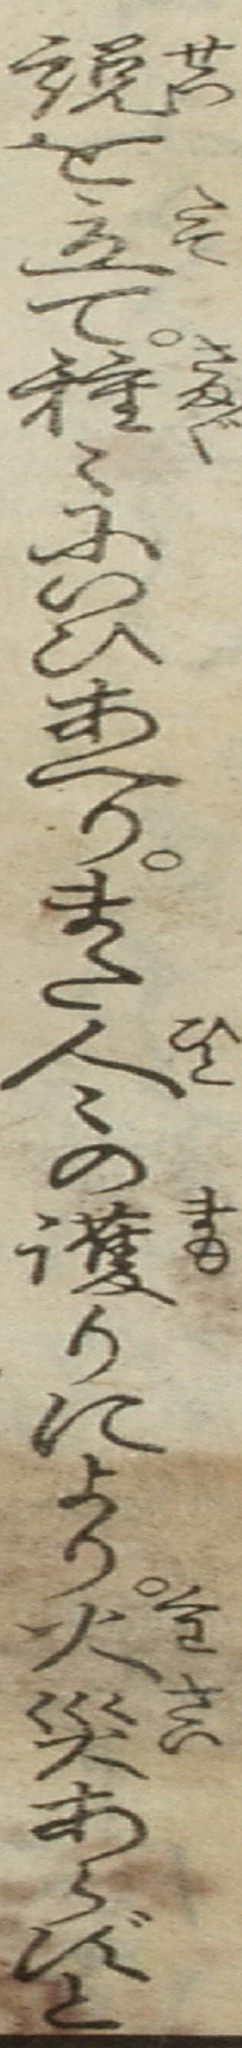説を立て。種〻にいひあへり。また人〻の護りにより。火災あらずと
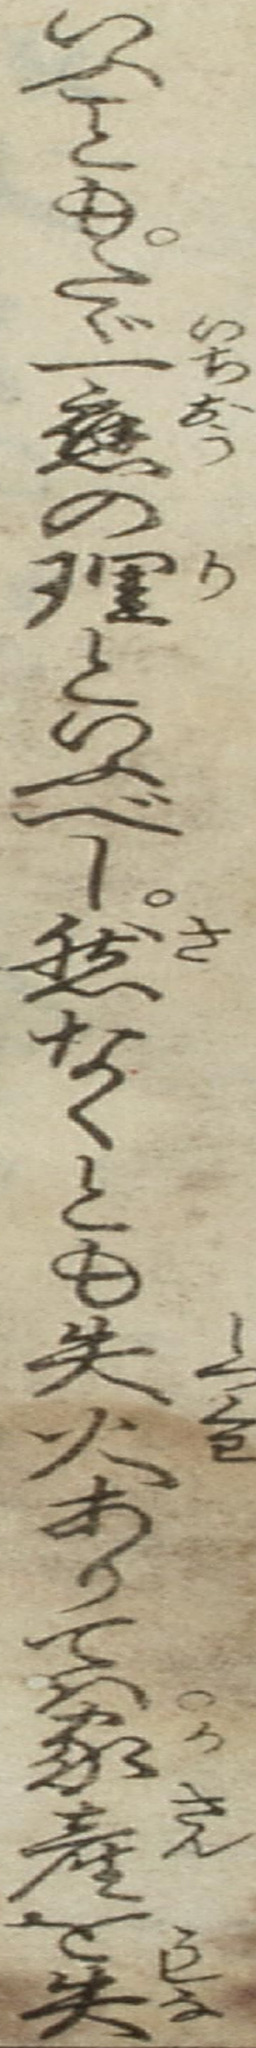いふことも。たゞ一応の理といふべし。然なくとも失火ありては。家産を失
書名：安政見聞録　中
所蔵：東京大学地震研究所図書室 Earthquake Research Institute Library, The University of Tokyo, JAPAN
